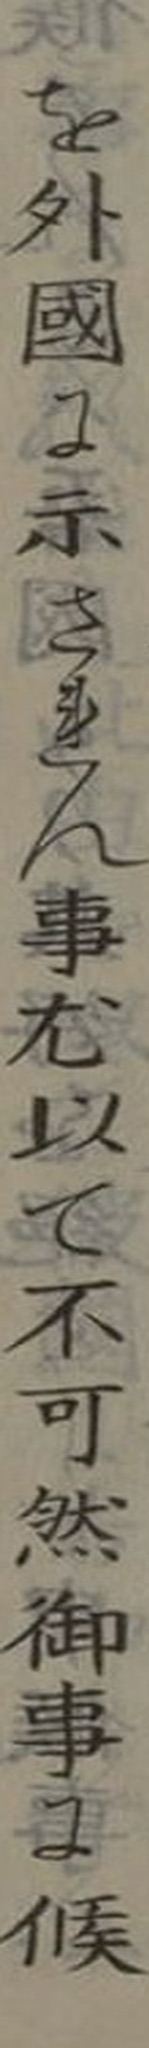を外國に示されん事尤以て不可然御事に候
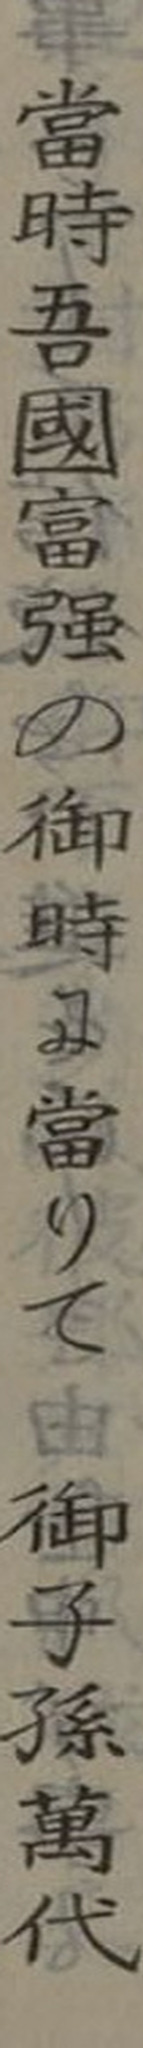當時吾國富強の御時に當りて御子孫萬代
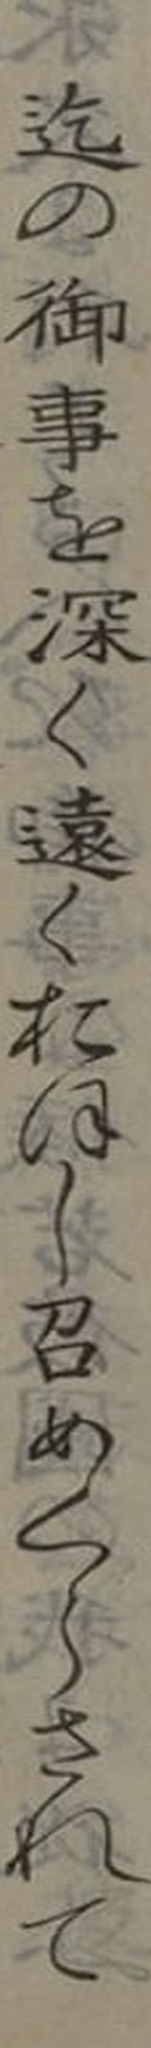迄の御事を深く遠くおほし召めたらされて
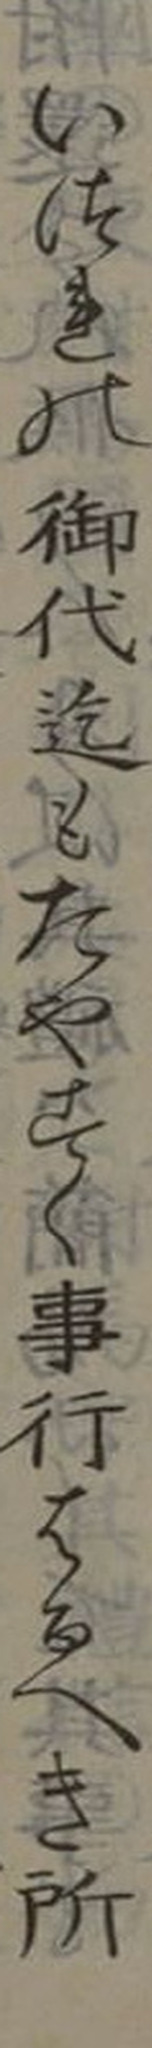いつれの御代迄もたやすく事行はるへき所
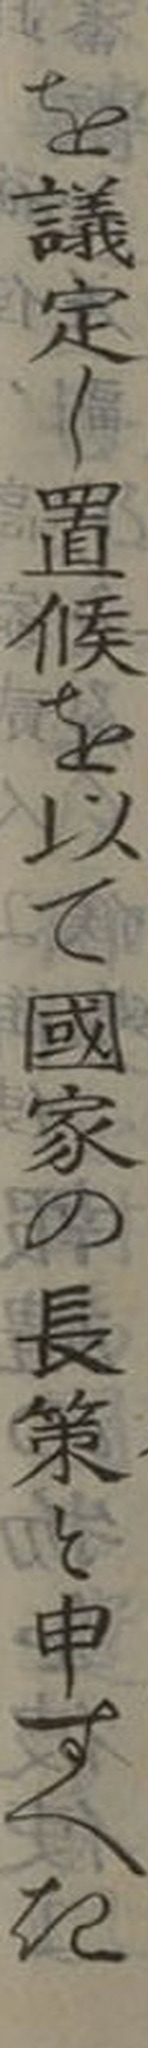を議定し置候を以て國家の長策と申すへき
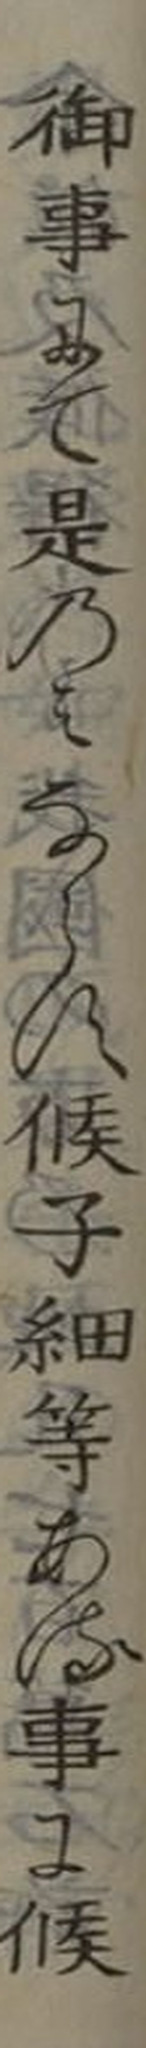御事にて是のみならす候子細等ある事に候
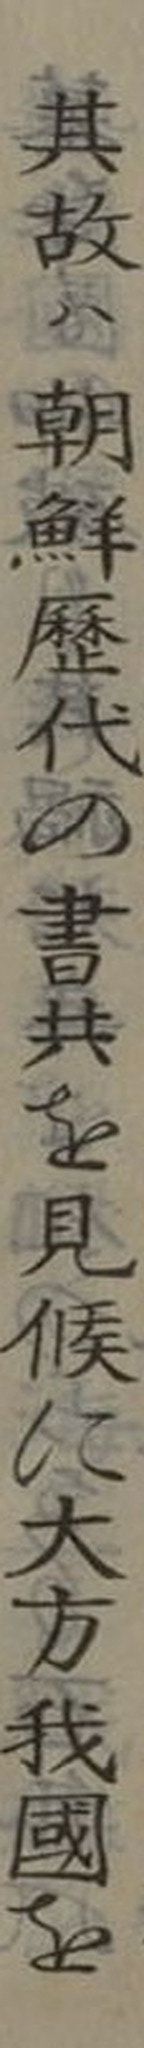其故は朝鮮歴代の書共を見候に大方我國を
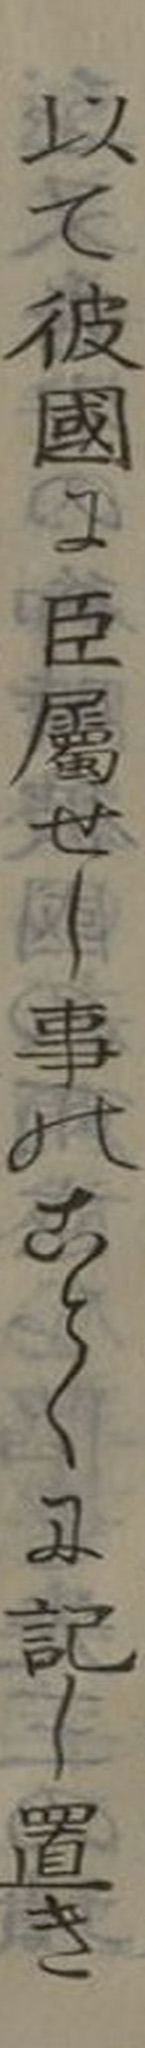以て彼國に臣屬せし事のことくに記し置き
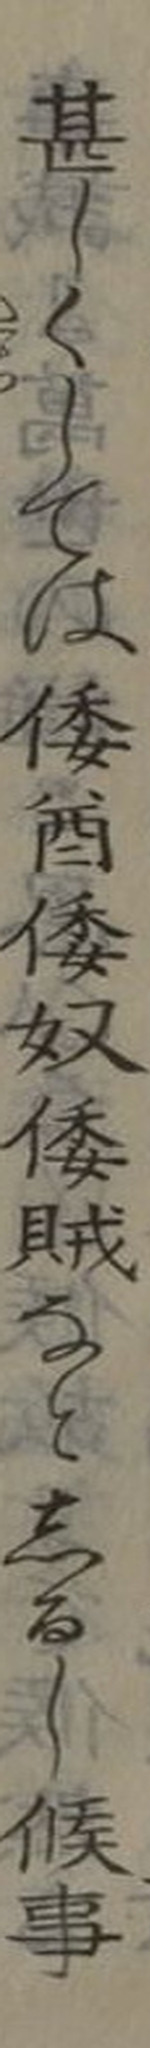甚しくしては倭酋倭奴倭賊なとしるし候事
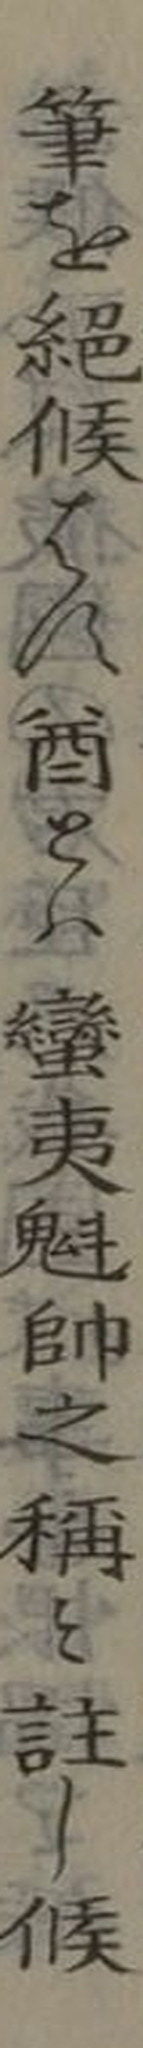筆を絕候はす酋とは蠻夷魁帥之稱と註し候
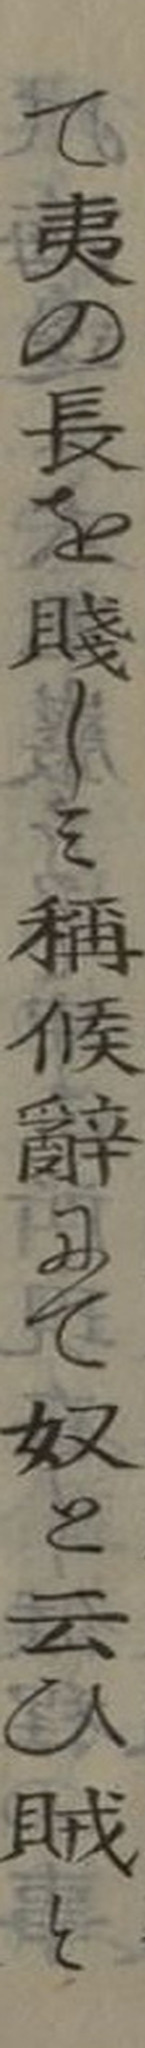て夷の長を賤しみ稱候辭にて奴と云ひ賊と
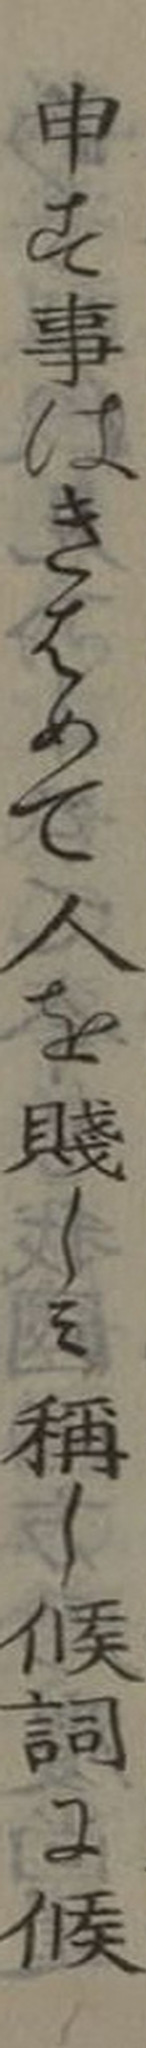申す事はきはめて人を賤しみ稱し候詞に候
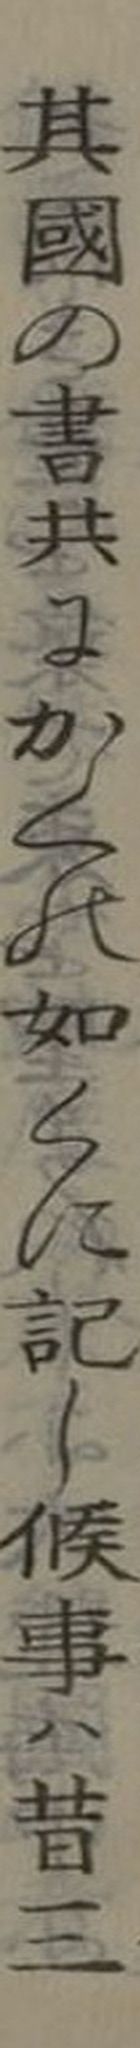其國の書共にかくの如くに記し候事は昔三
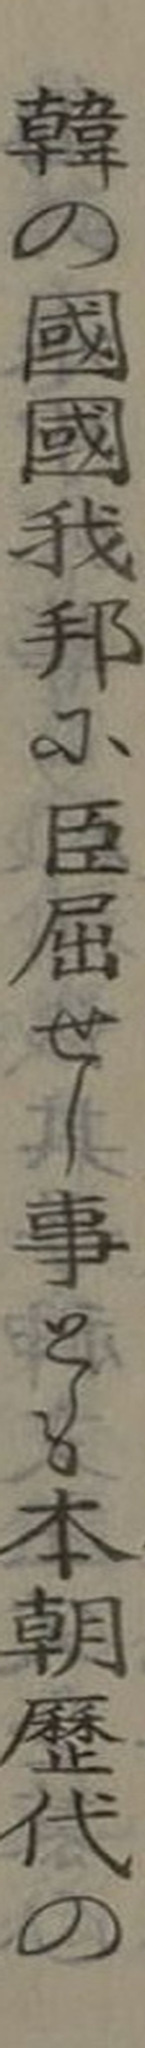韓の國國我邦に臣屈せし事とも本朝歴代の
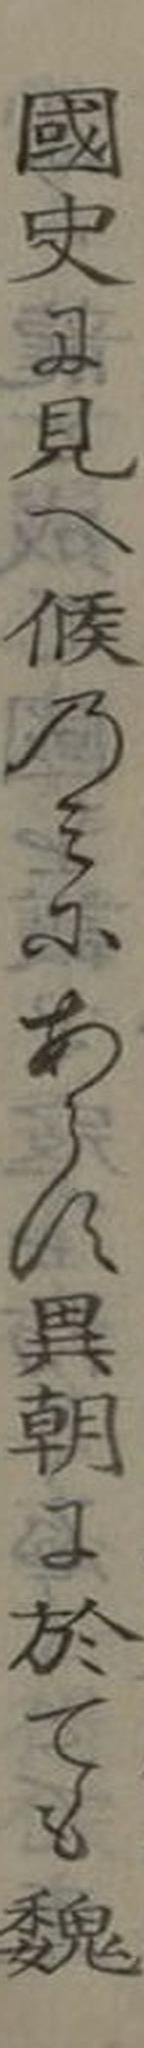國史に見へ候のみにあらす異朝に於ても魏
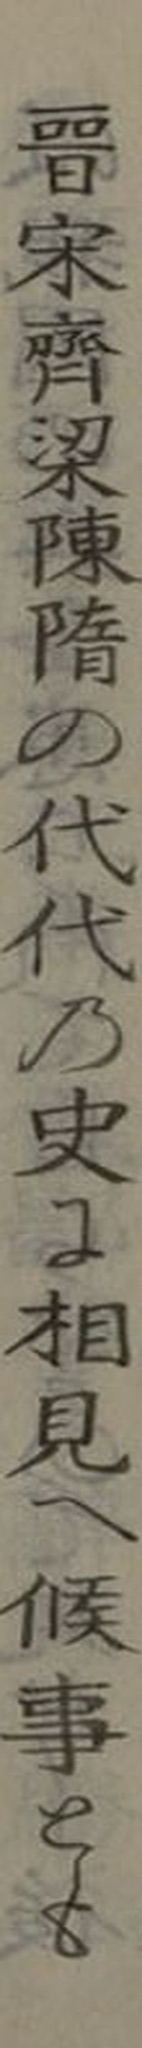宋齊梁陳隋の代代の史に相見へ候事とも
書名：骨董録
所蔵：University of the Ryukyus Library
